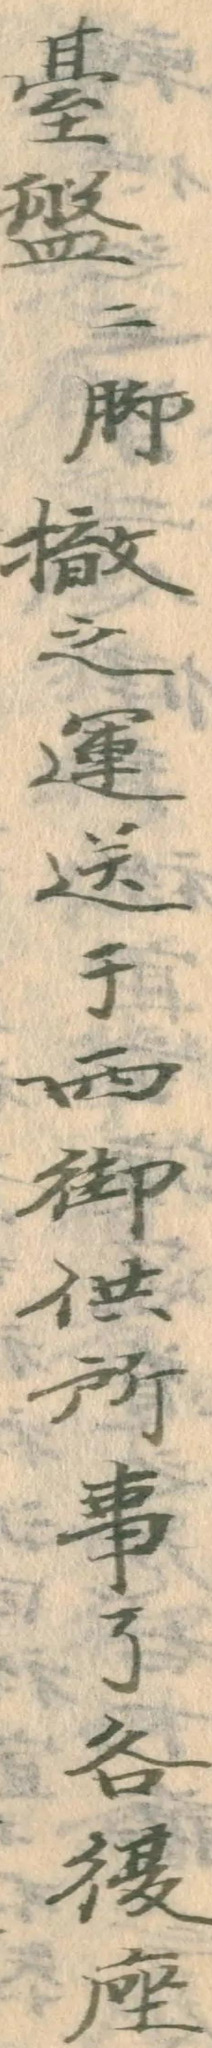台盤二脚撤之運送于西御供所事了各復座
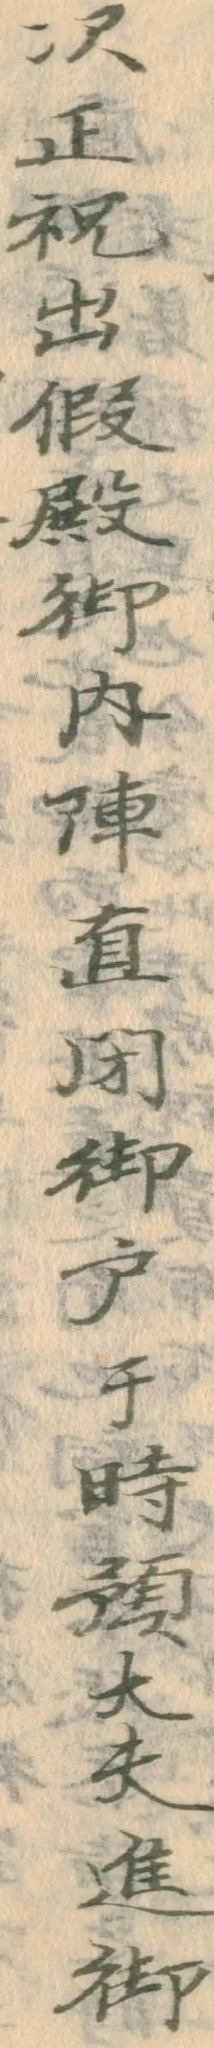次正祝出仮殿御内陣直閉御戸于時預大夫進御
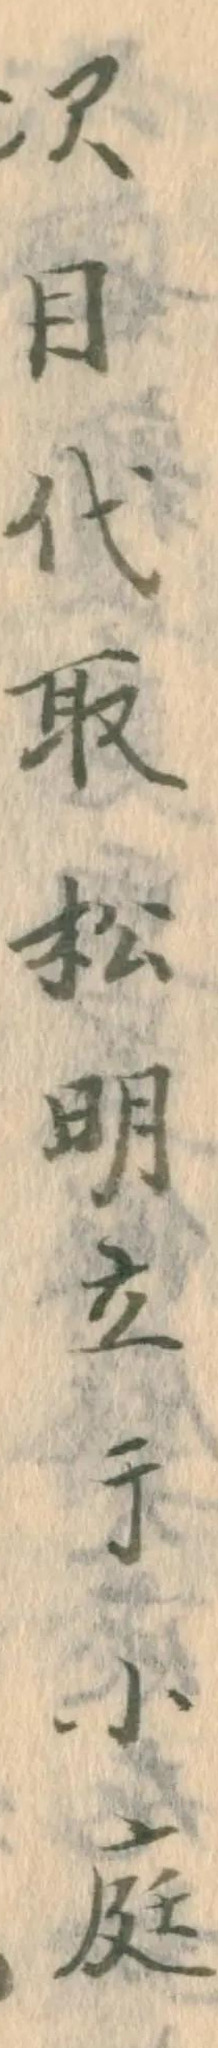次目代取松明立于小庭
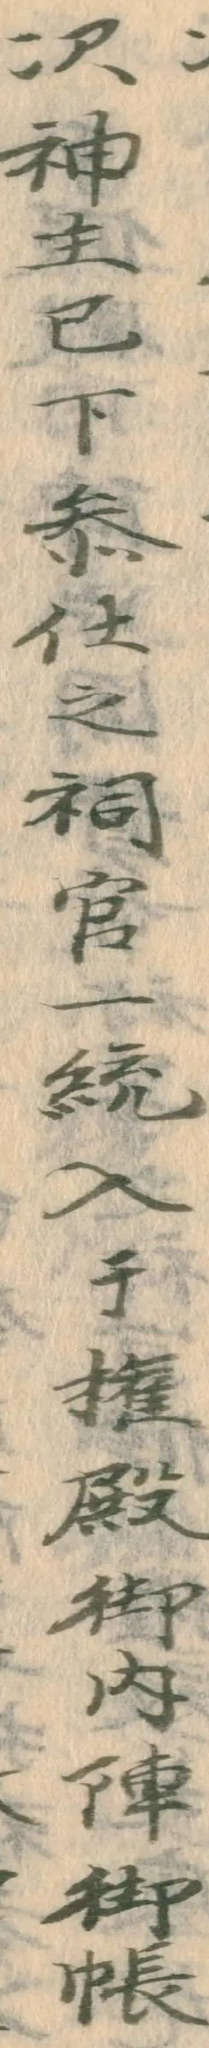次神主已下参仕之祠官一統入于権殿御内陣御帳
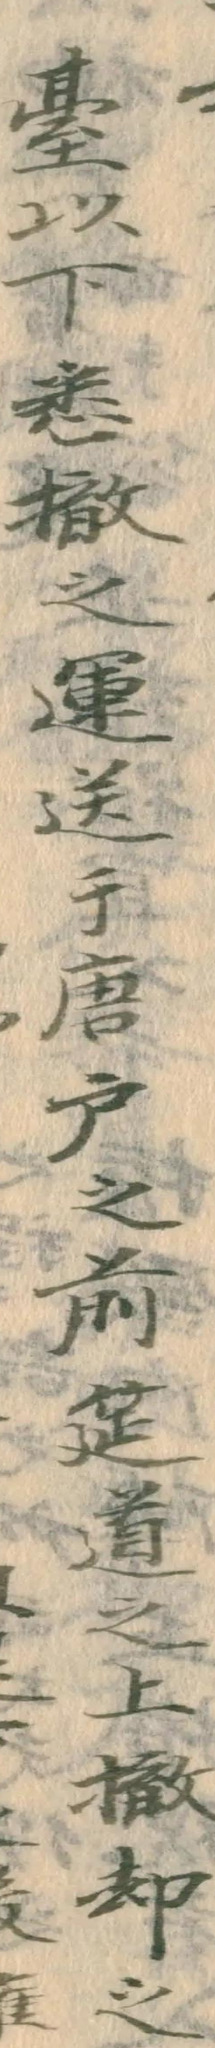台以下悉撤之運送于唐戸之前筵道之上撤却之
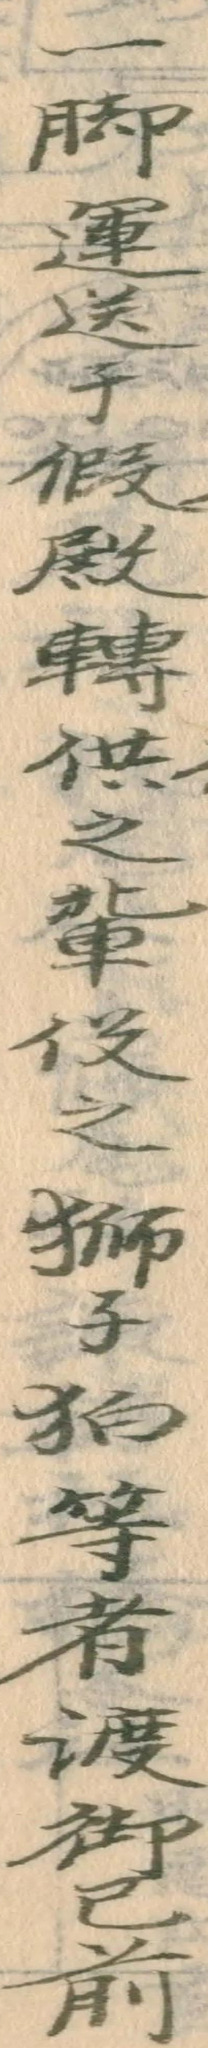一脚運送于仮殿転供之輩役之獅子狛等は渡御已前
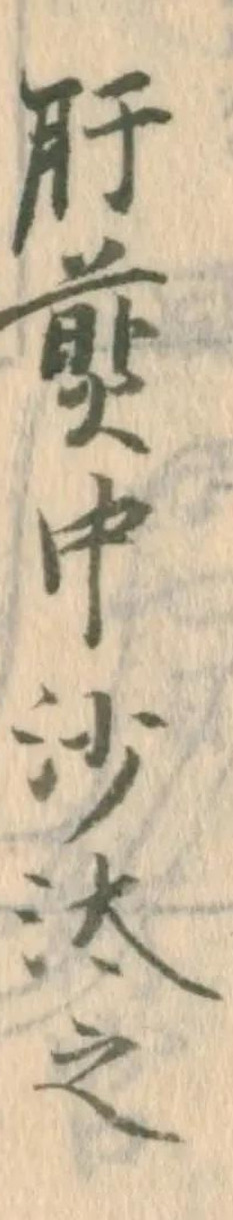肝煎中沙汰之
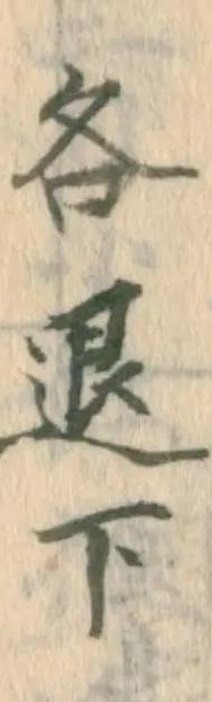各退下
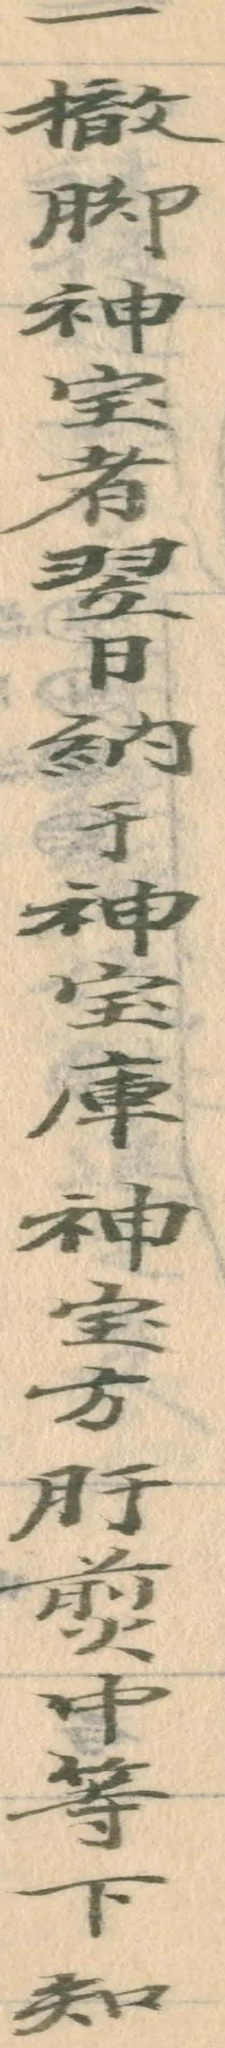一撤脚神宝は翌日納于神宝庫神宝方肝煎中等下知
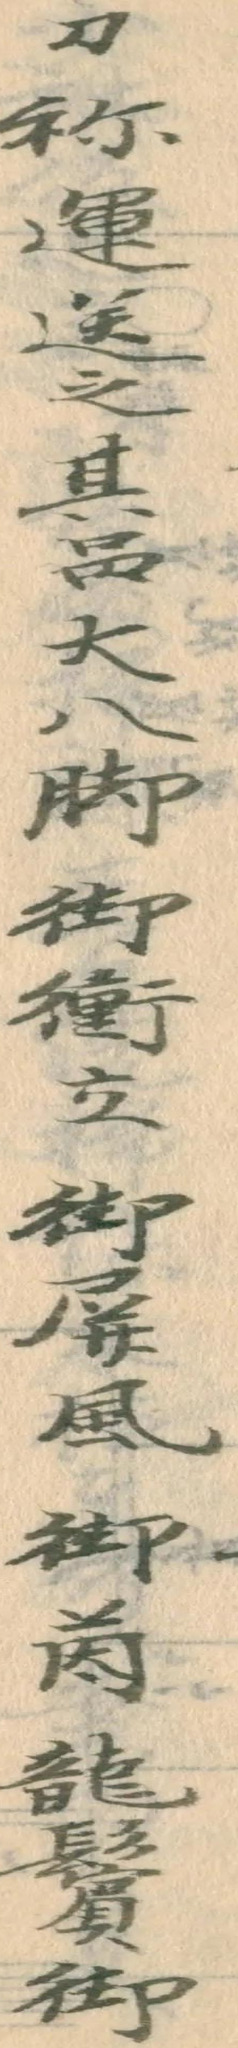刀祢運送之其品大八脚御衝立御屏風御茵御龍鬢御
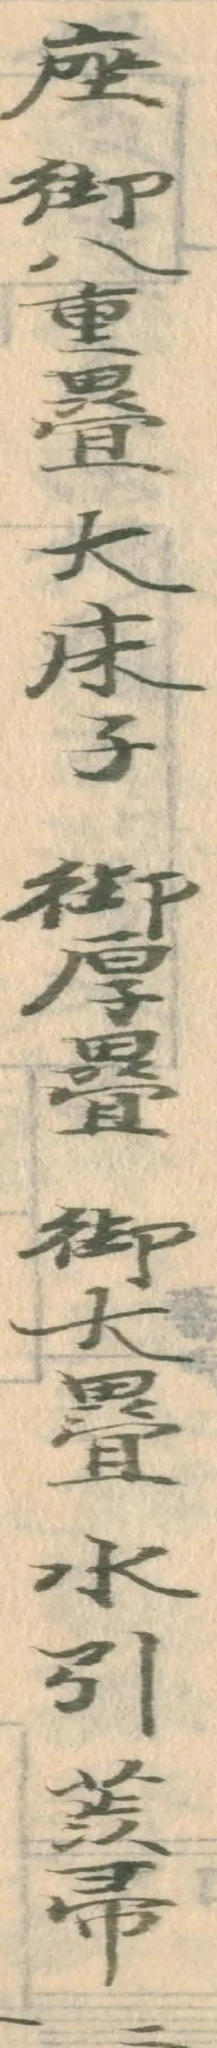座御八重畳大床子御厚畳御大畳水引蕊帚ニ
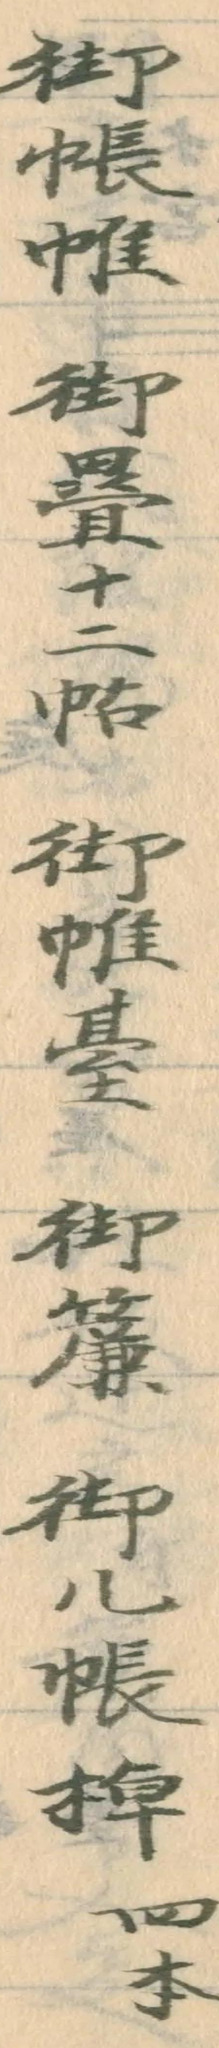御帳帷御畳十二帖御帷台御簾御几帳棹四本
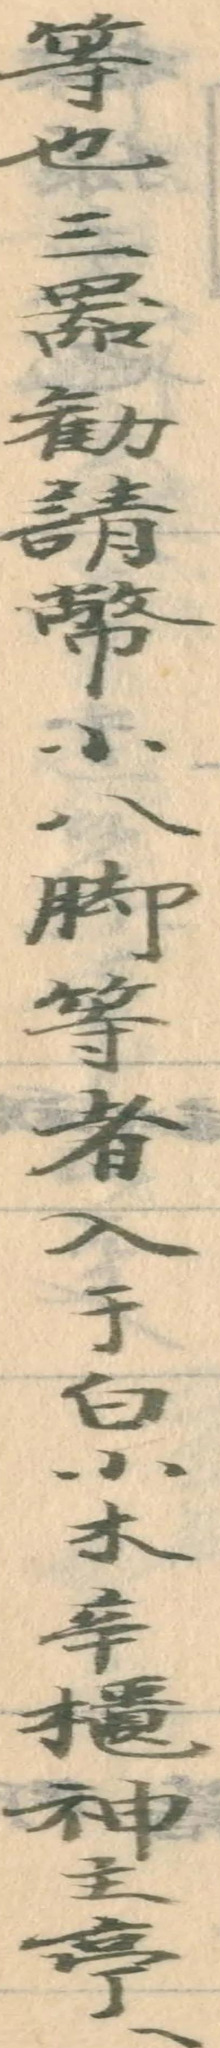等也三器勧請幣小八脚等は入于白小木辛櫃神主亭へ

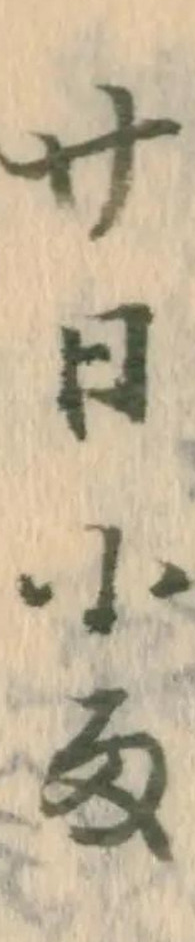廿日小雨
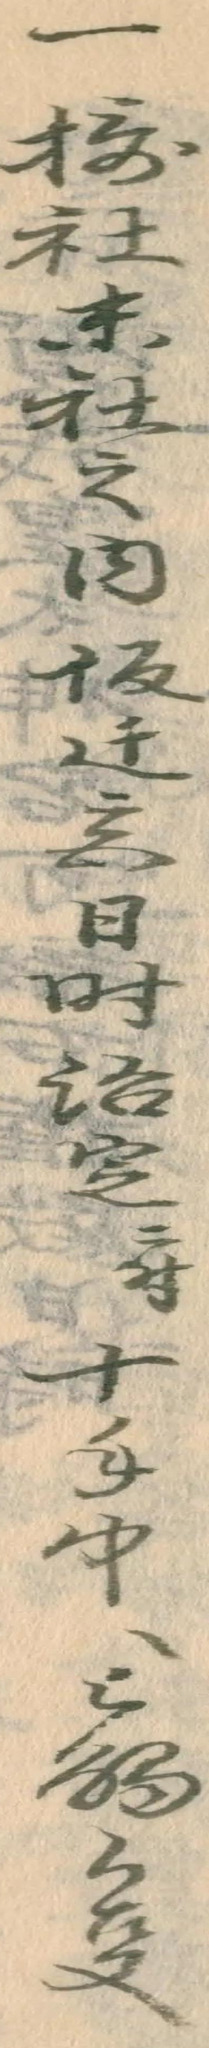一摂社末社之内仮迁宮日時治定ニ付十手中へ被触候事
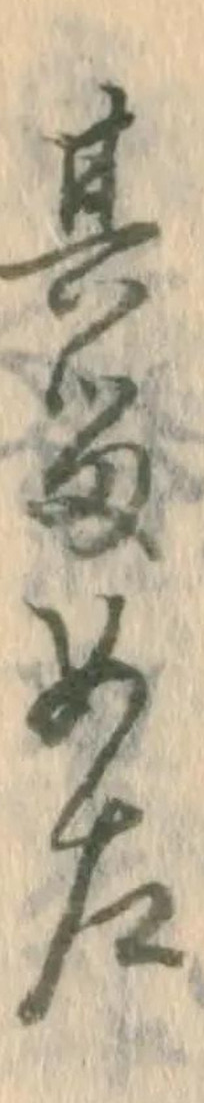其留如左
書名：賀茂社記録. 第17冊
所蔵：国立国会図書館 National Diet Library, JAPAN
